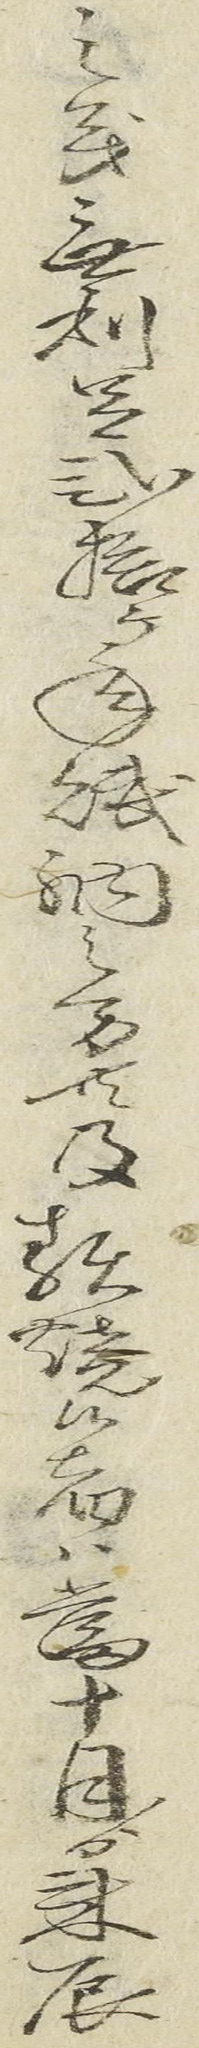之義無利足弐拾ヶ年賦納之方共及類焼候者ハ当十月ゟ来辰

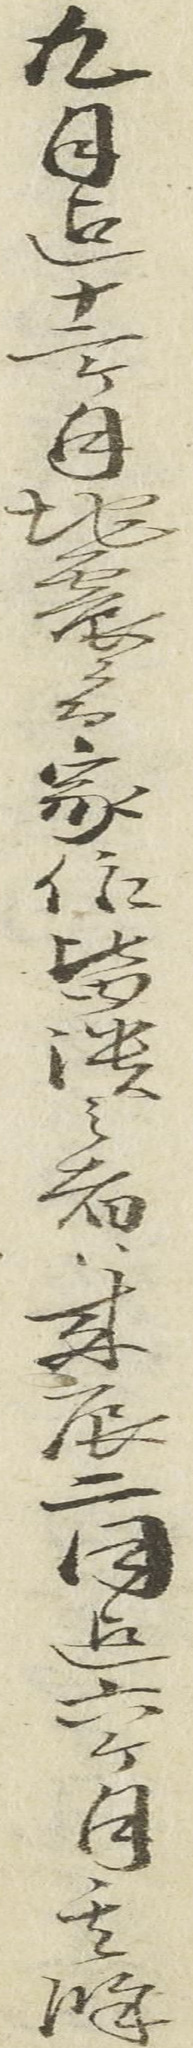九月迄十二ケ月地震にて家作皆潰の者は来辰二月迄六ケ月其餘
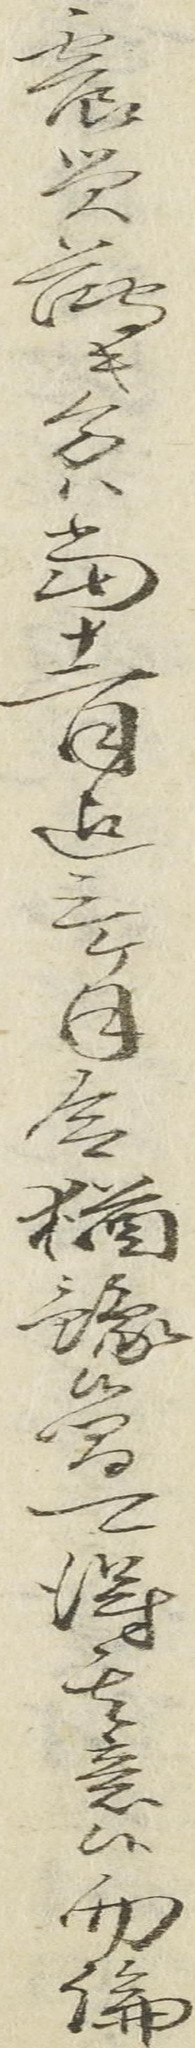震災薄キ方ハ当十二月迄三ケ月令猶予候間可得其意候勿論
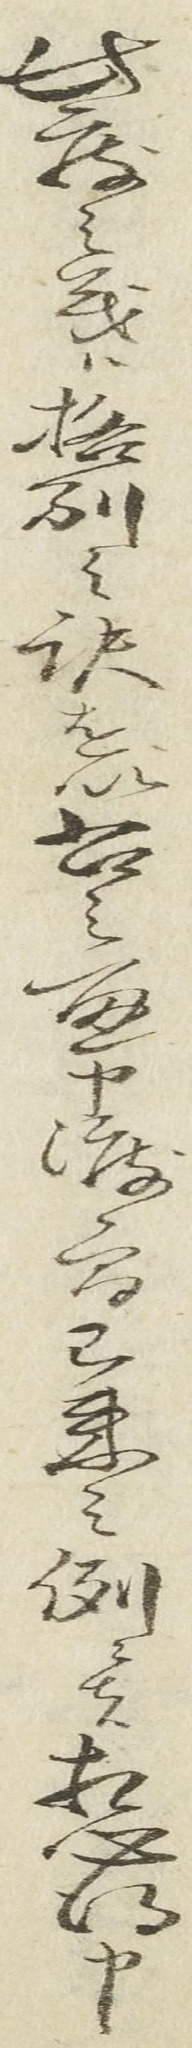此度之義ハ格別之訳を以右之通申渡候間已来之例ニは相必得申
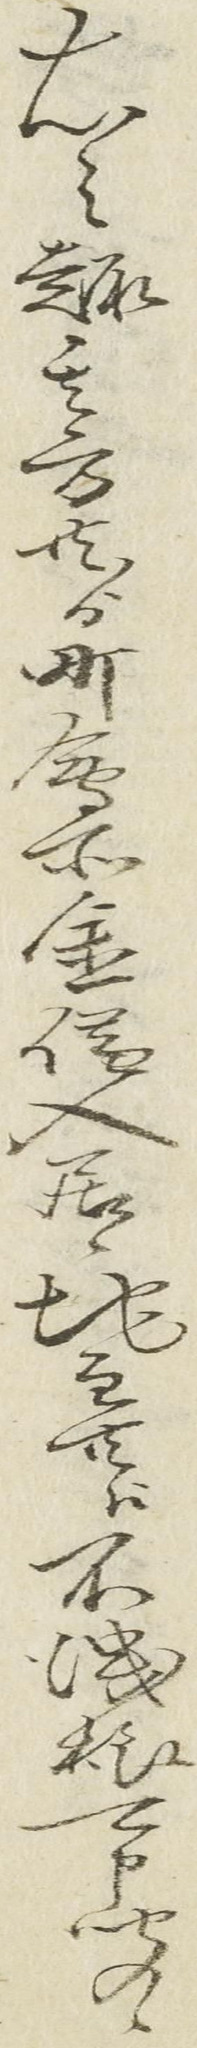右之趣其方共ゟ町会所金借入居候地主共え不洩様可申聞候
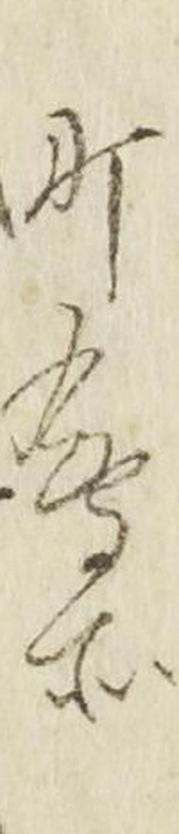町会所
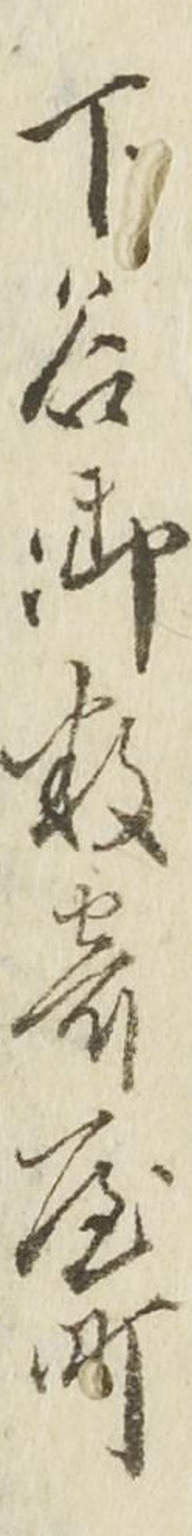下谷御数寄屋町
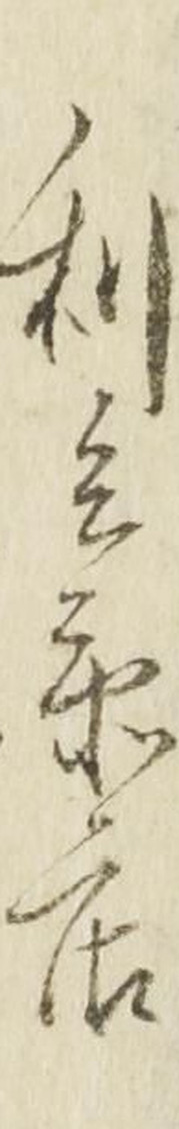利兵衛店
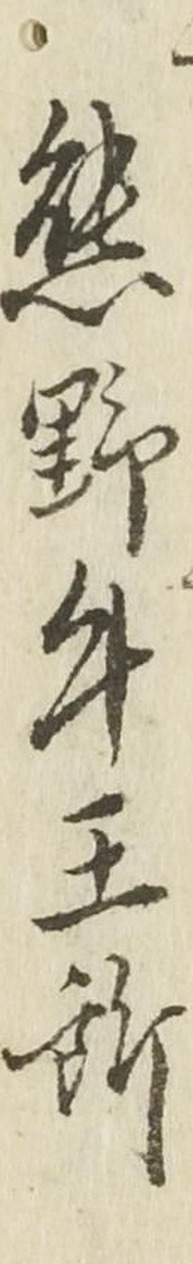熊野牛王所
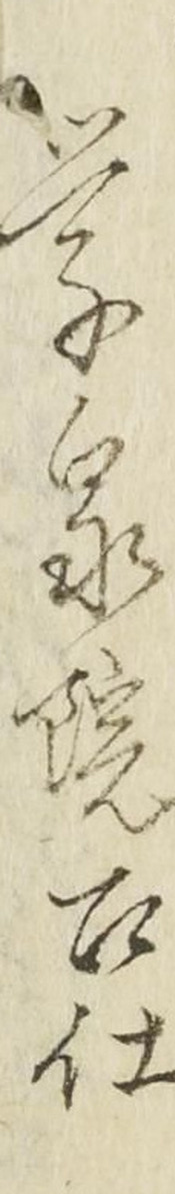学泉院召仕
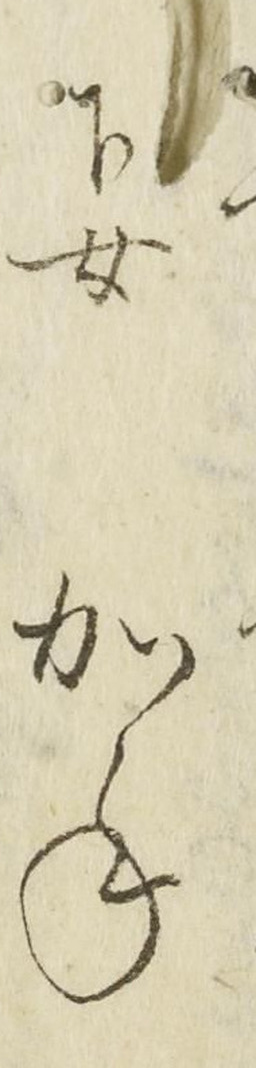下女かね
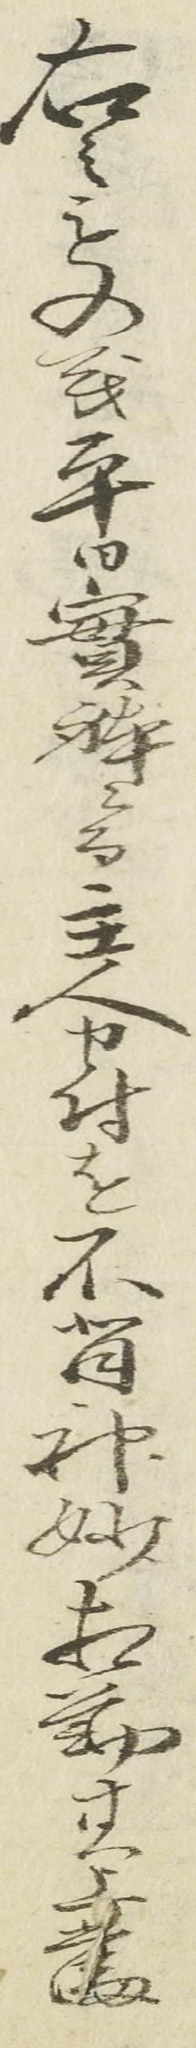右之もの義平日実躰ニ而主人申付を不背神妙相勤其上当
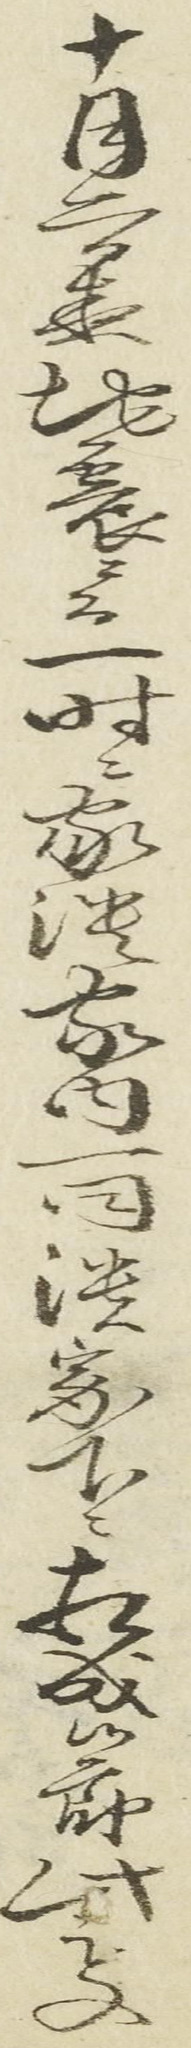十月二日夜地震ニ而一時二家潰家内一同潰家下ニ相成候節此もの
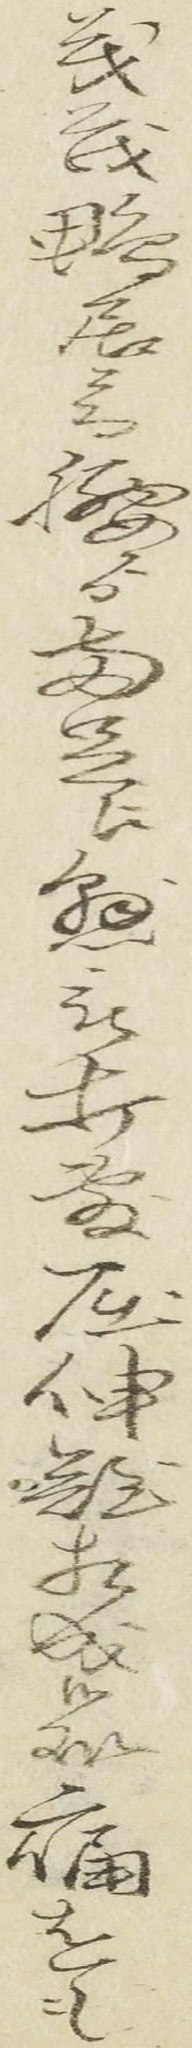義も鴨居ニ而腰ゟ両足え懸被打敷屈伸難相成候処痛をも
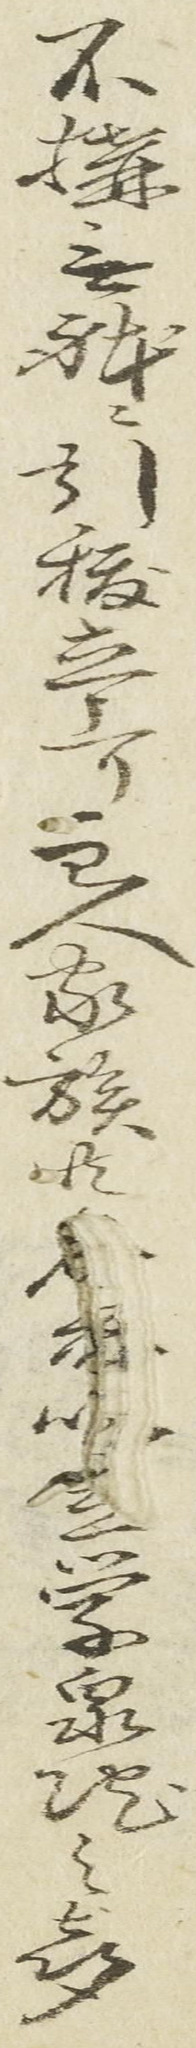不構無躰二引抜立上り主人家族共学泉院之声
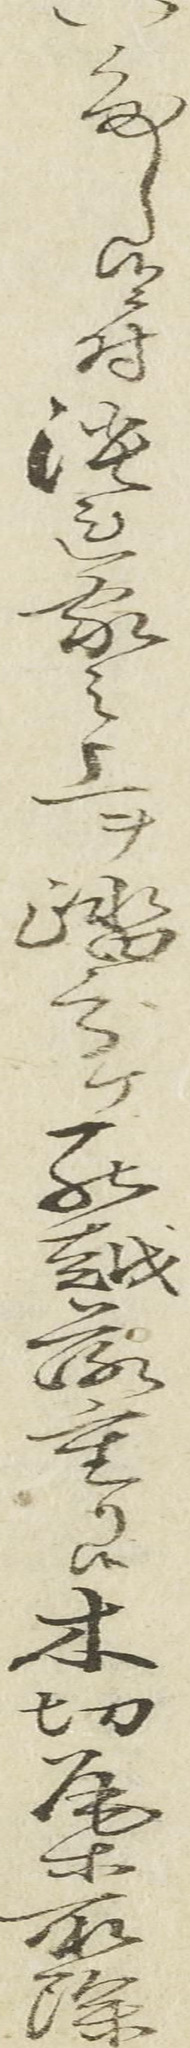いたし候ニ付潰れ家之上ヲ踏分ケ罷越落重り候木切瓦等取除
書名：安政二乙卯年十月二日大地震之事
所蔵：東京大学地震研究所図書室 Earthquake Research Institute Library, The University of Tokyo, JAPAN
